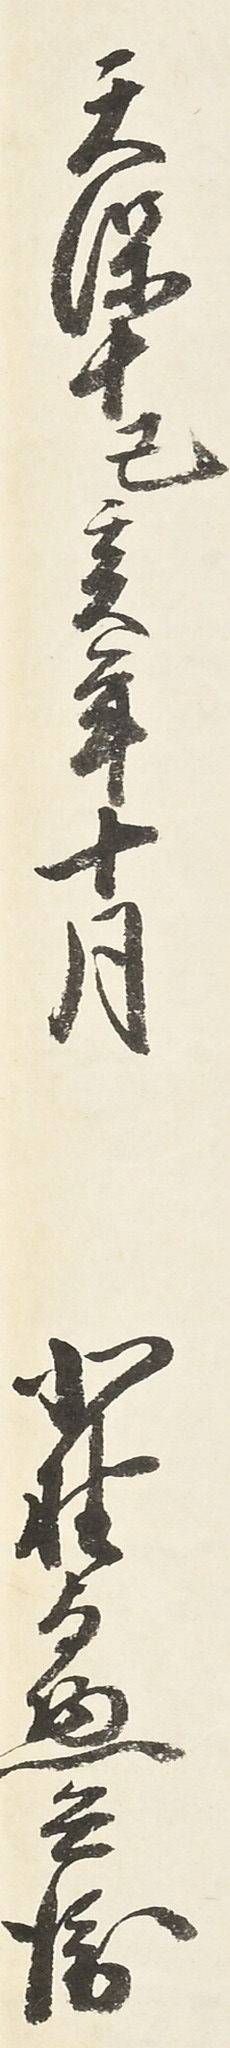天保十己亥年十月北野与惣兵衛㊞
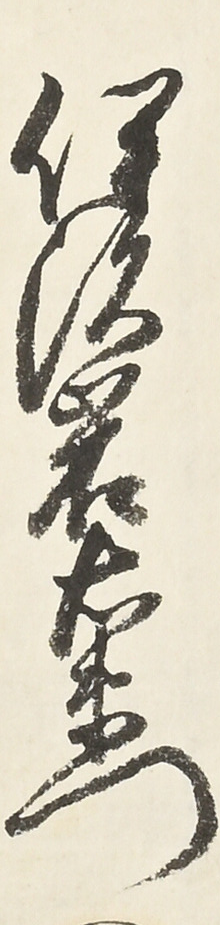伊沢岩右衛門㊞
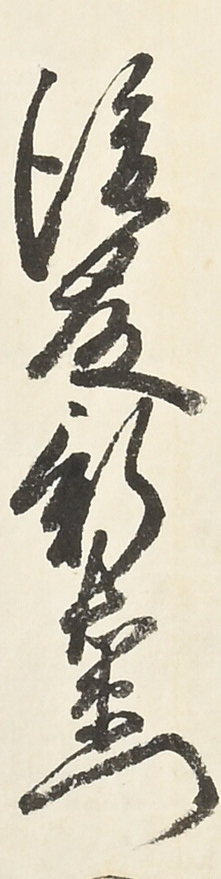後藤新右衛門㊞
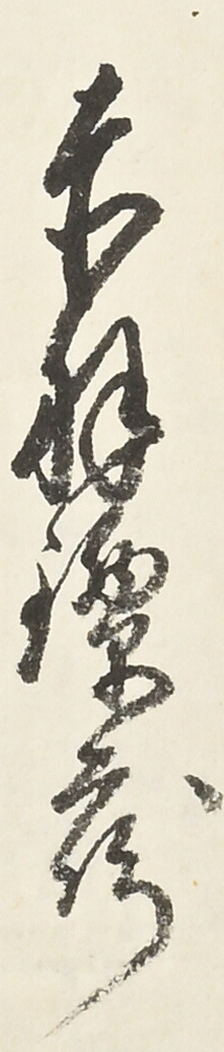赤羽鏢蔵
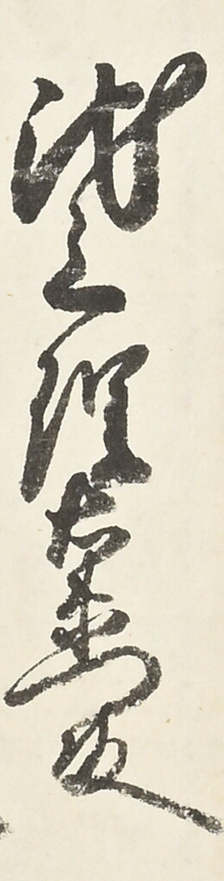池上理右衛門殿
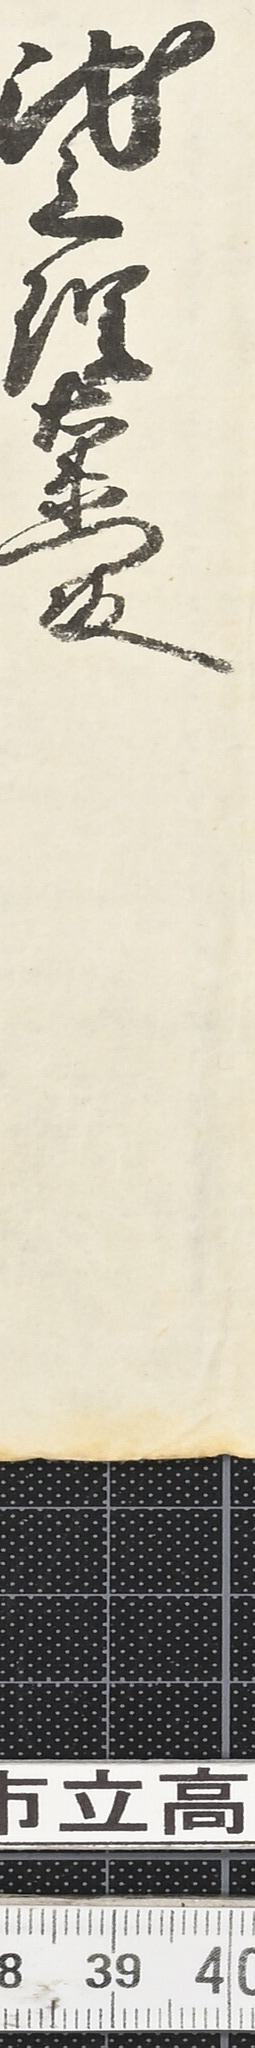池上理右衛門殿
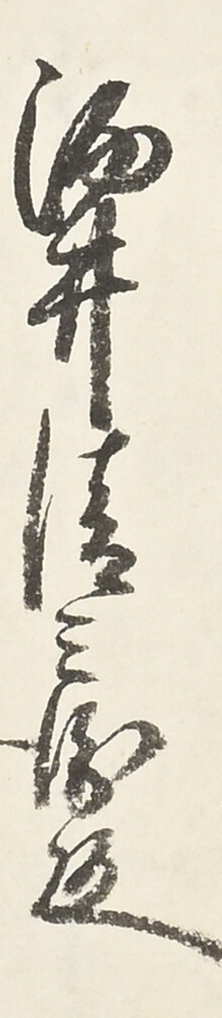酒井清兵衛殿
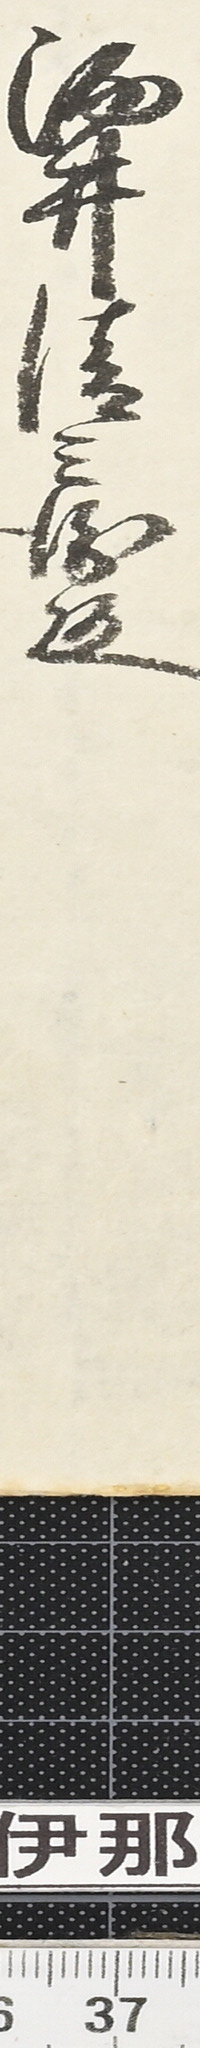酒井清兵衛殿
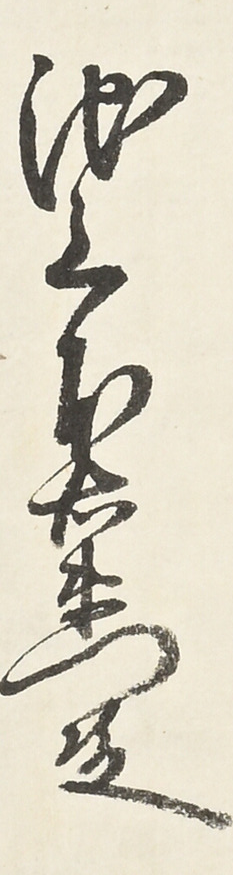池上理右衛門殿

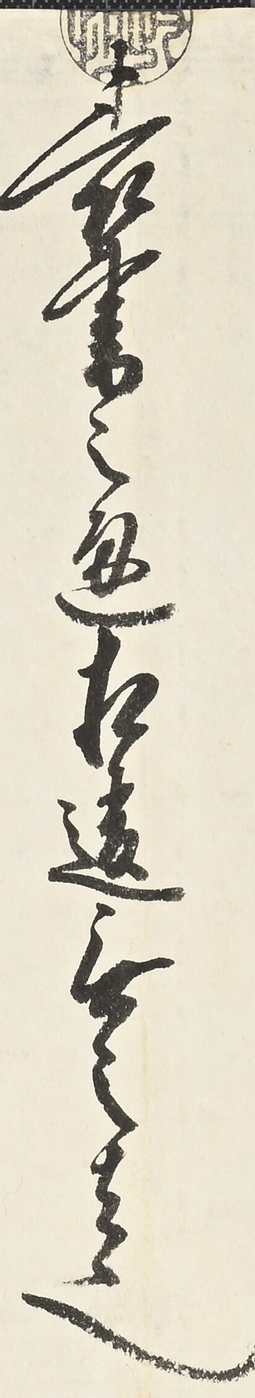表書之通相違無之者也
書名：覚
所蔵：伊那市立高遠町図書館・合同会社AMANE
